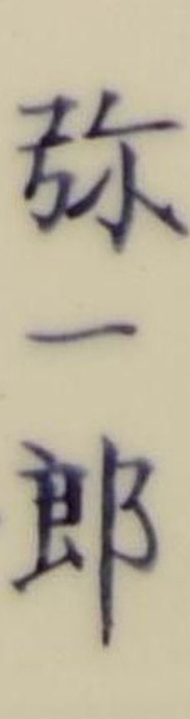弥一郎
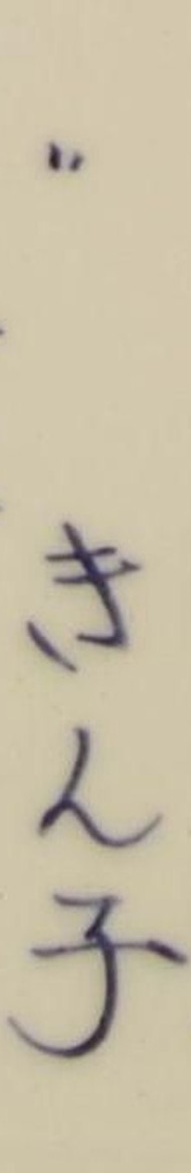きん子
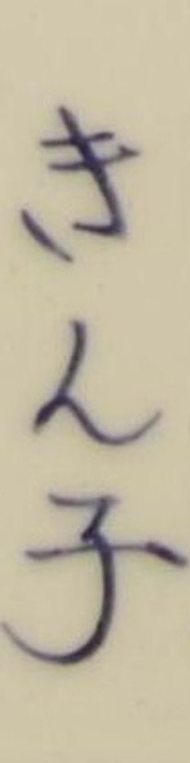きん子
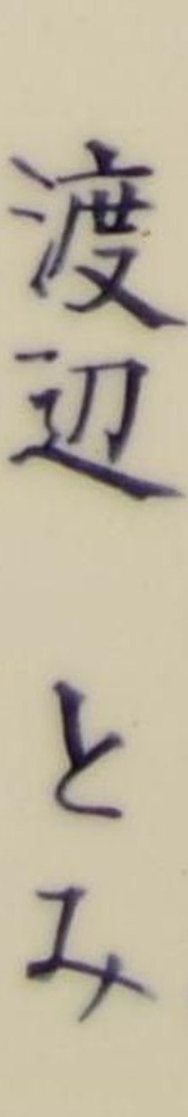渡辺とみ
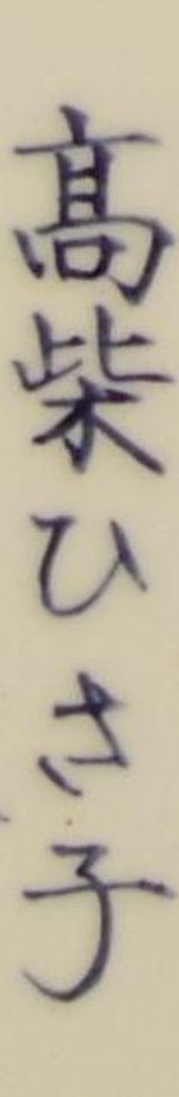高柴ひさ子
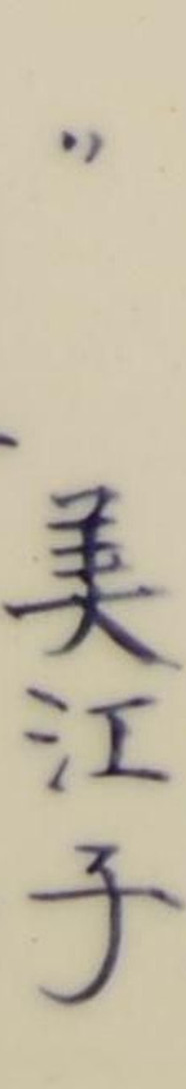美江子
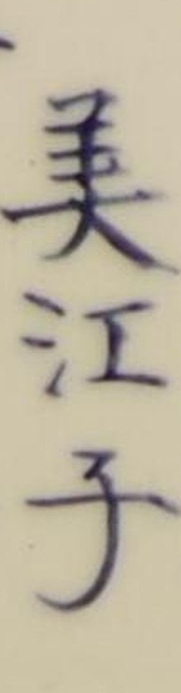美江子
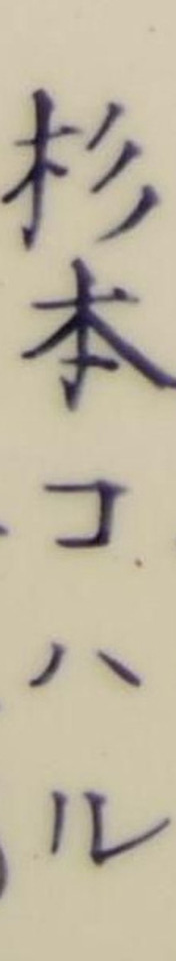杉本コハル
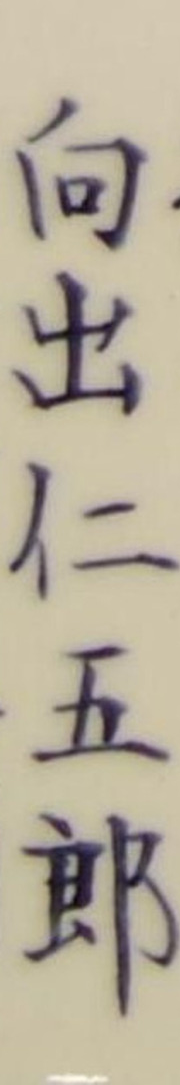向出仁五郎
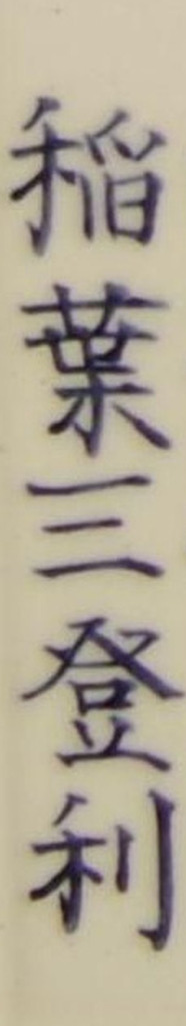稲葉三登利

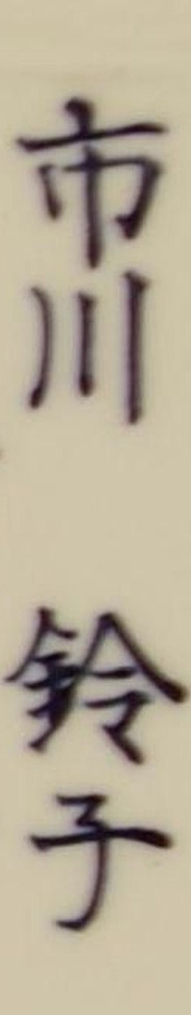市川鈴子
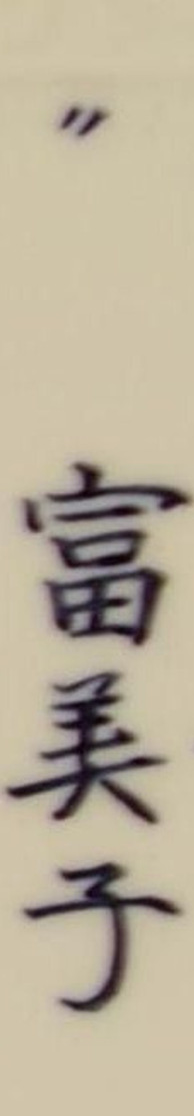富美子
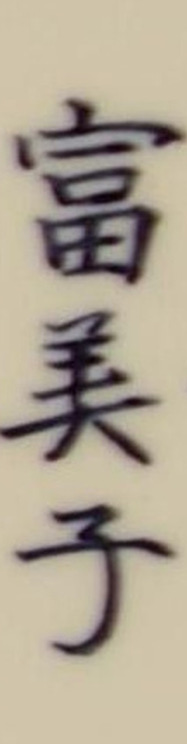富美子
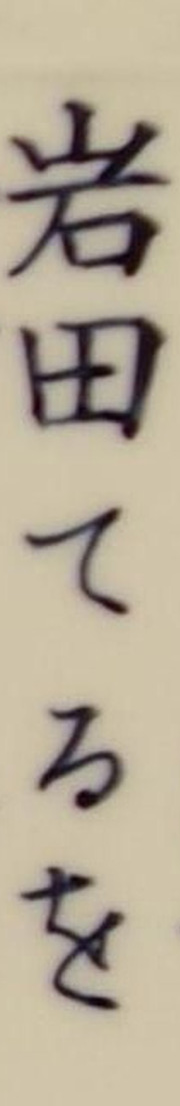岩田てるを
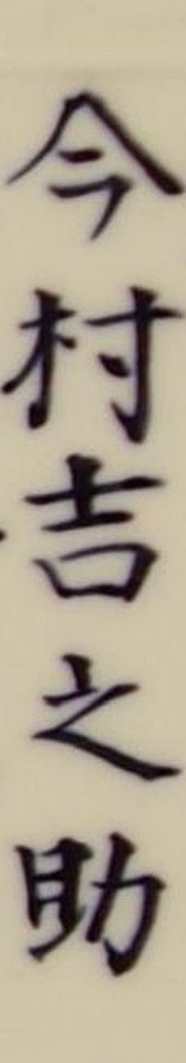今村吉之助
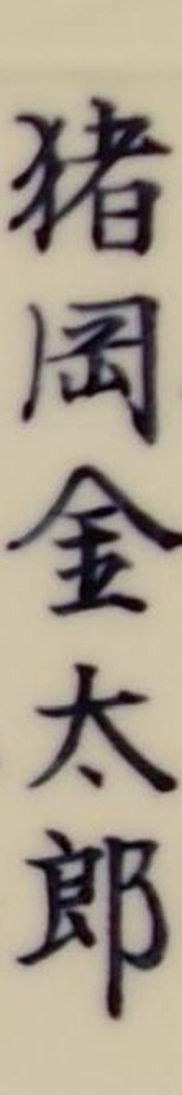猪岡金太郎
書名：E~L
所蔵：高野山金剛峯寺
